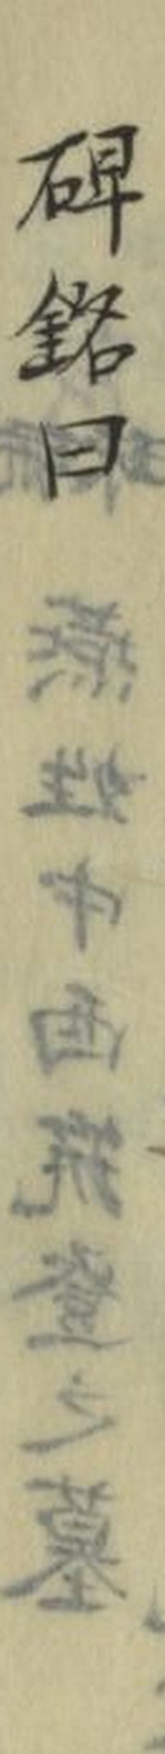碑銘曰

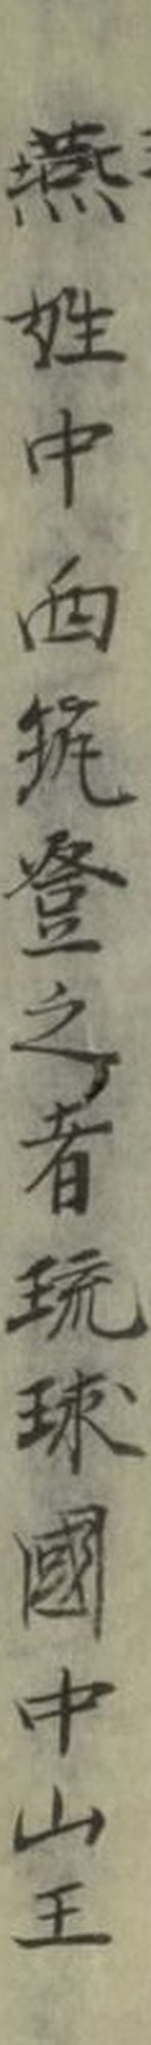燕姓中西筑登之者琉球国中山王
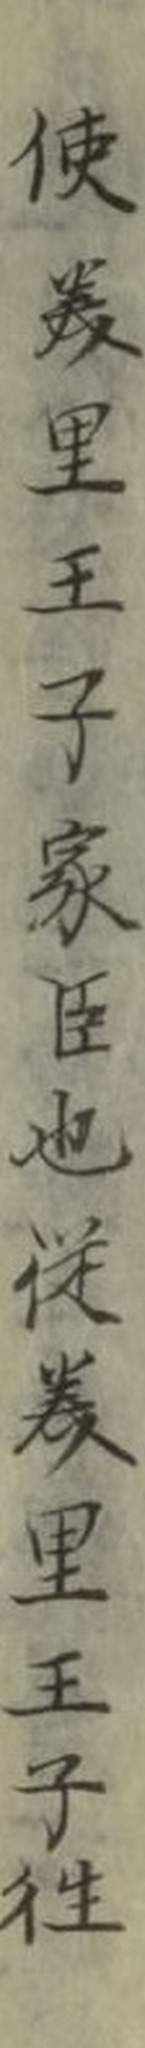使美里王子家臣也従美里王子往
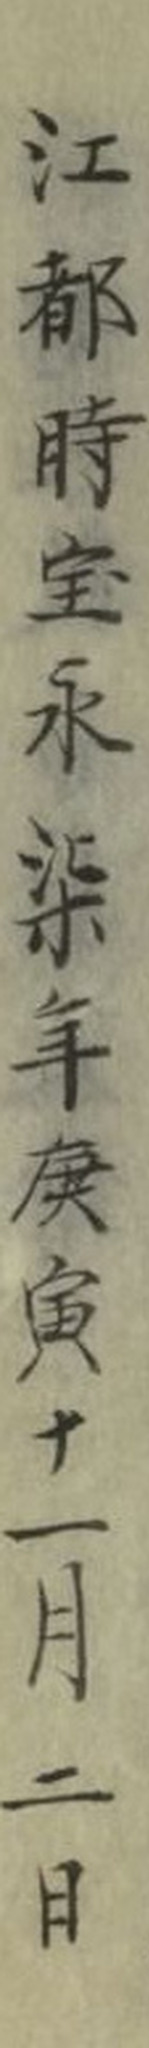江都時宝永漆年庚寅十一月二日
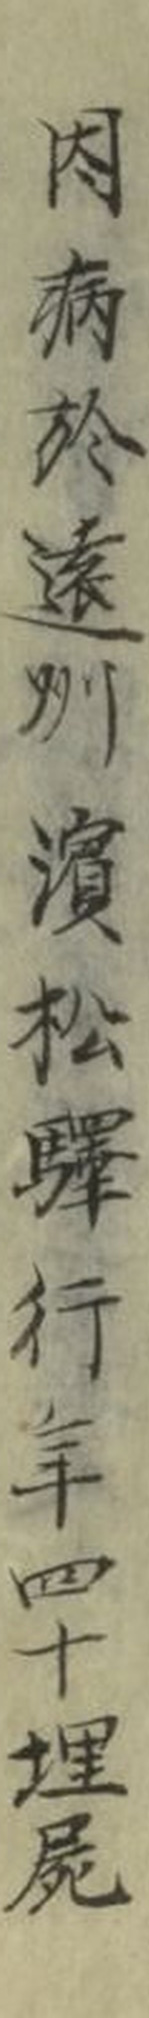因病於遠州浜松駅行年四十埋屍
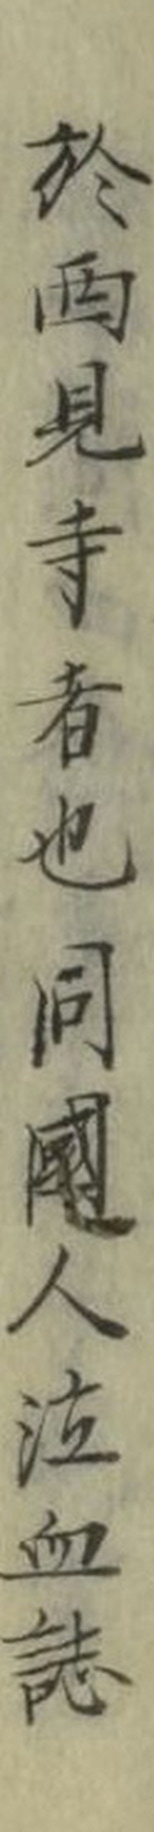於西見寺者也同国人泣血誌
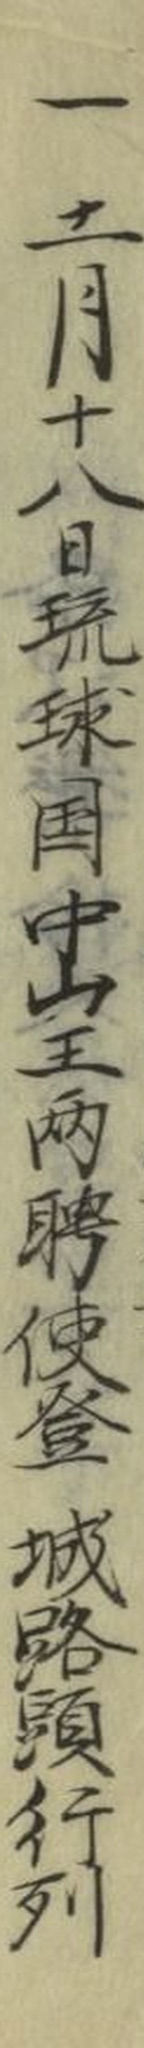一十一月十八日琉球国中山王両聘使登城路頭行列

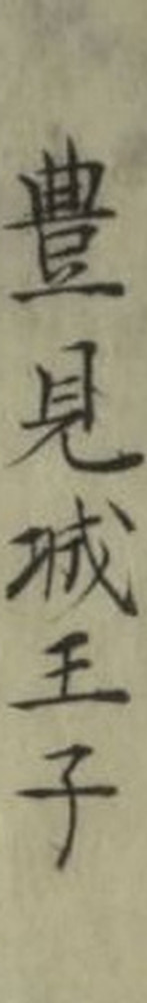豊見城王子
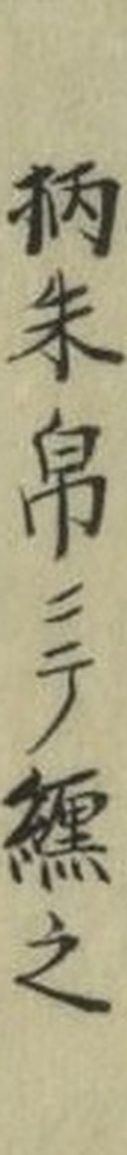柄朱帛にて纒之
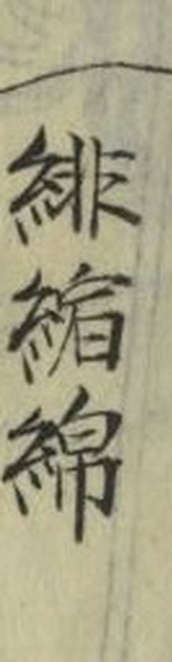緋縮綿

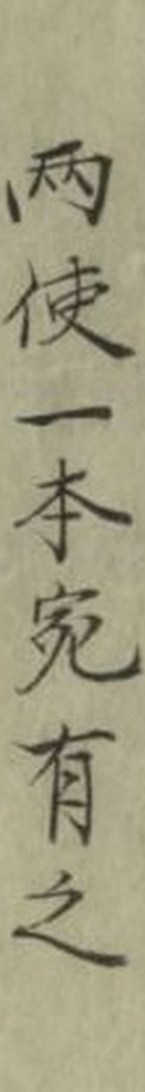両使一本宛有之
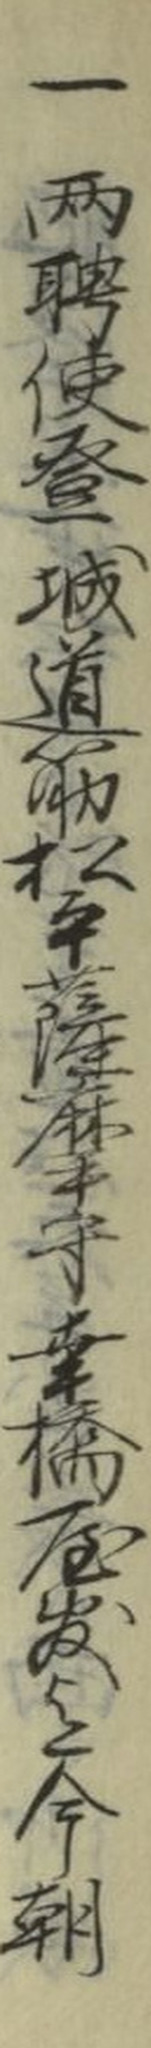一両聘使登城道筋松平薩摩守幸橋屋敷迄今朝
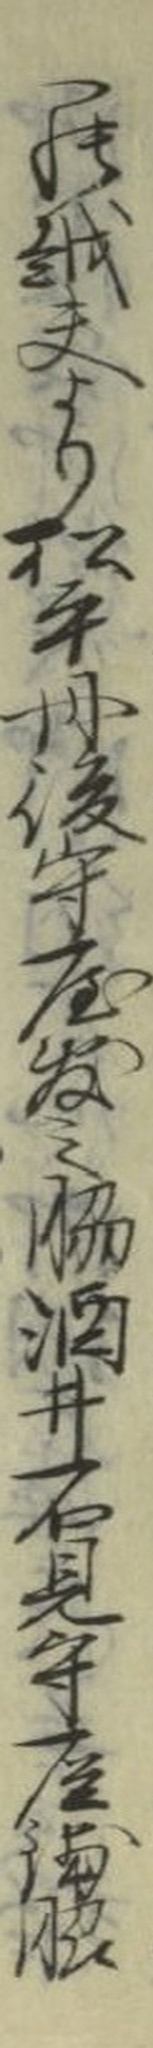罷越夫より松平丹後守屋敷之脇酒井石見守屋鋪脇
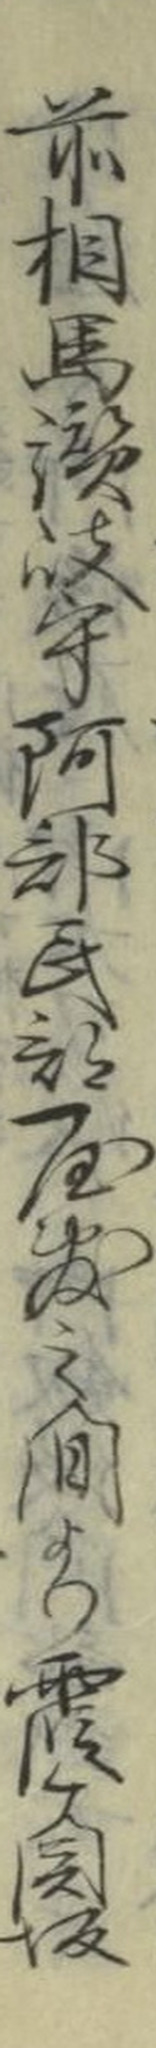前相馬讃岐守阿部民部屋敷之間より霞ヶ関坂
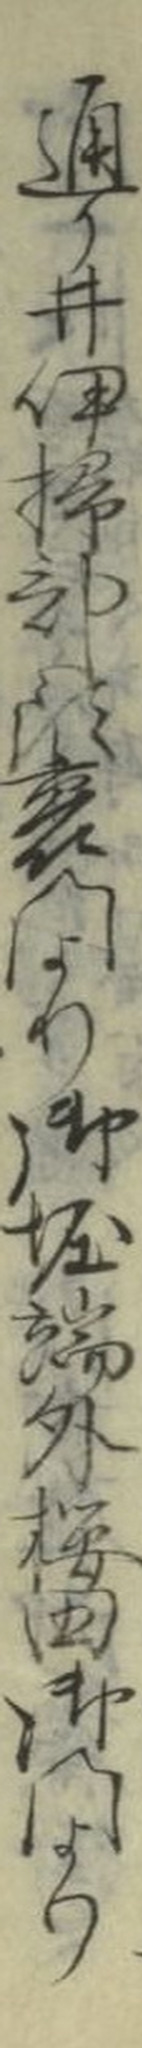通り井伊掃部頭裏門より御堀端外桜田御門より
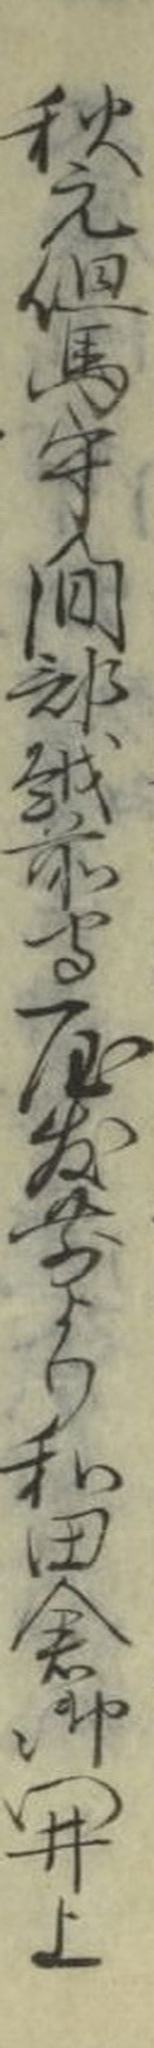秋元但馬守間部越前守屋敷前より和田倉御門井上
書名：宝永七庚寅年琉球国来聘使日記
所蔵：University of the Ryukyus Library
